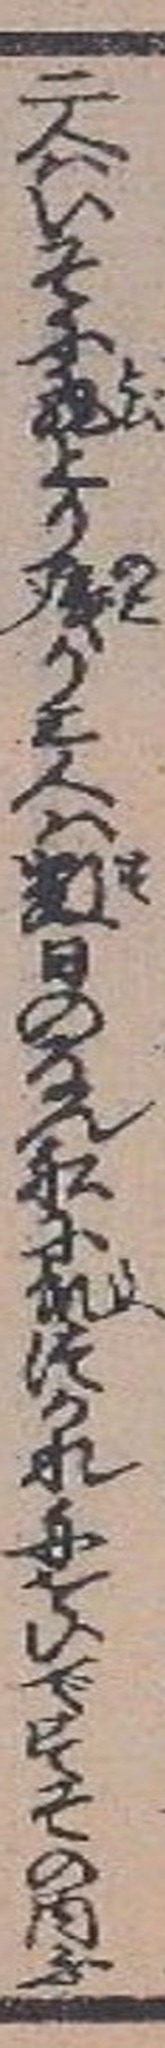二人はいそに飛上り残り三人は数日のなん船に飢つかれ舟をいですその内ふ
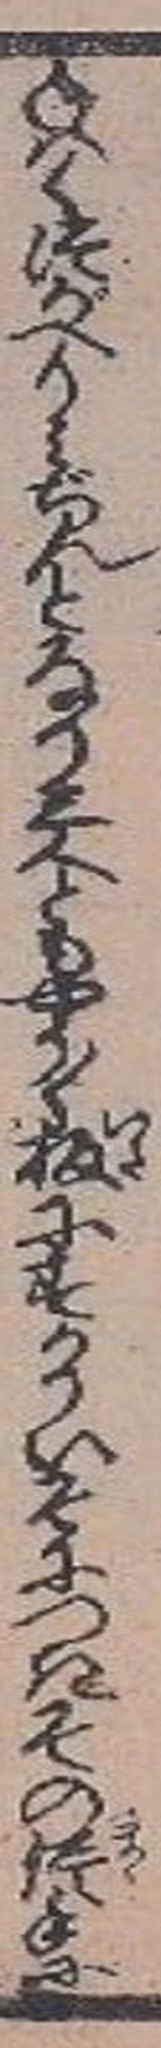ねはくつがへりみぢんとなり三人ともやう〳〵板にすかりいそにつきその儘手に
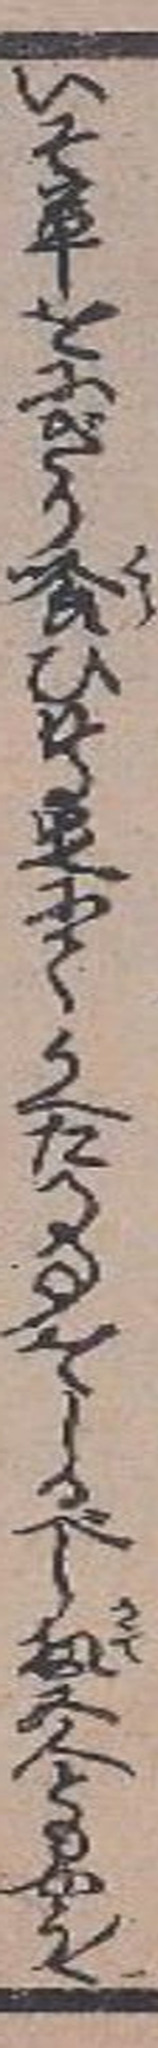いそ草をにぎり喰ひける是にてうへたる事をしるべし扨五人ともやう〳〵
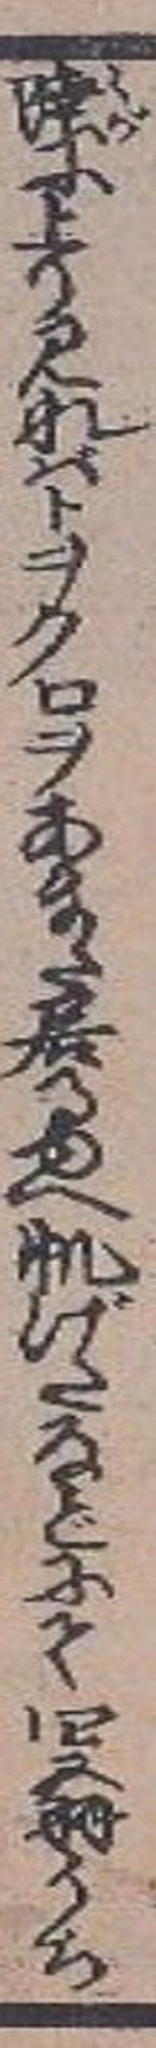陸に上り見ればトヲクロヲあまた居るゆへ帆げたなどにて四五羽うち
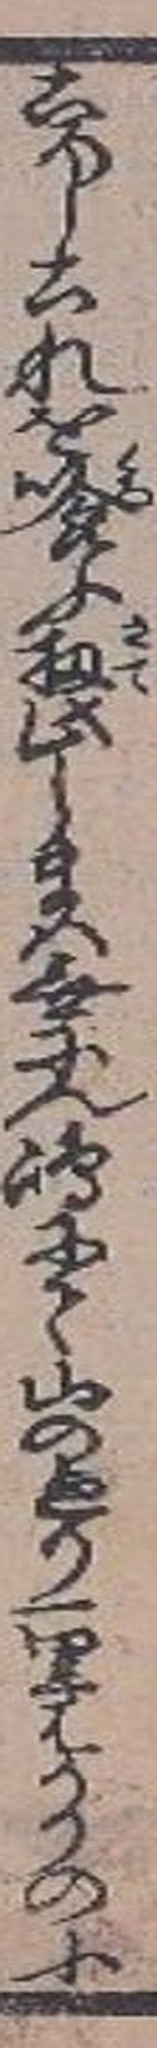ころしこれを喰ふ扨此しまは無にん嶋にて山の廻り一里はかりの小
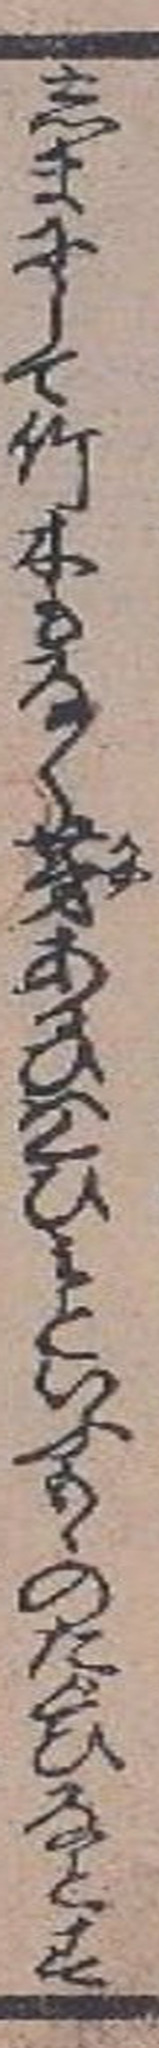しまにして竹木もなく茅あるひはくひみといふもゝのたぐひなとす
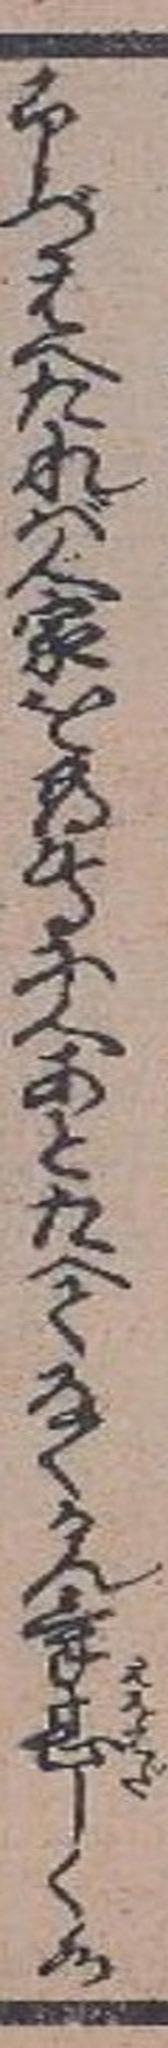こしづゝはへたれば人家を尋けるに人あとたへてなくかん気甚しく水

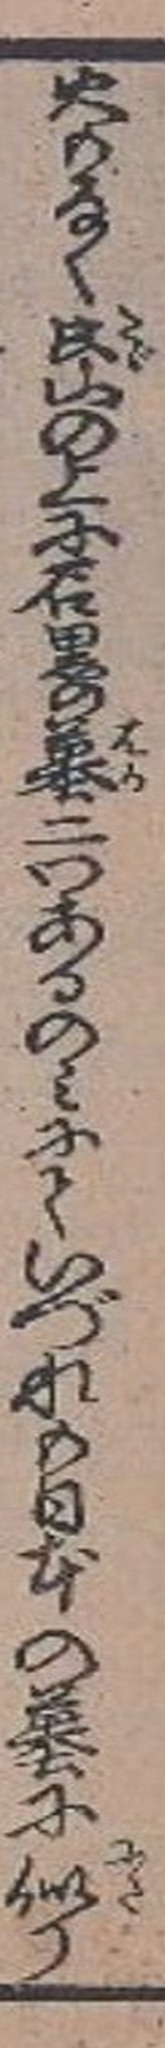火もなく只山の上に石塁？の墓二ツあるのみにていづれも日本の墓に似り
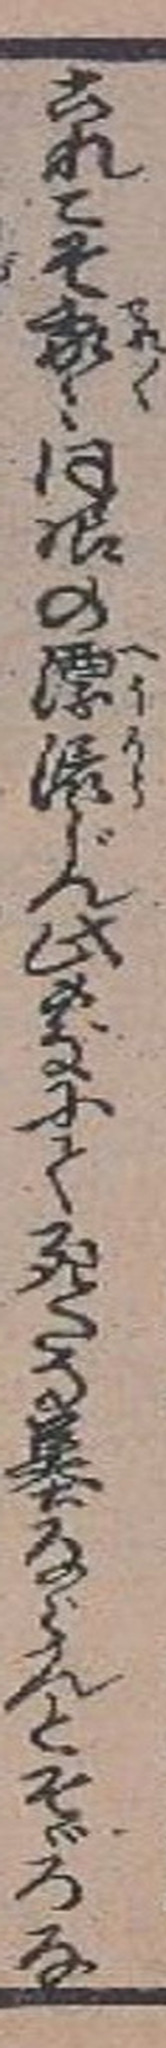これこそ我々同様？の漂流じん此処にて死たる墓ならんとそゞろな
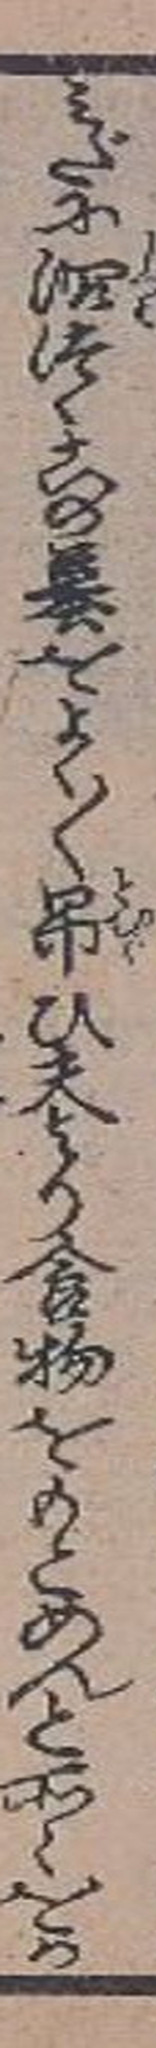みだに沈つゝこの墓をよく〳〵弔ひ夫より食物をもとめんと所々をか
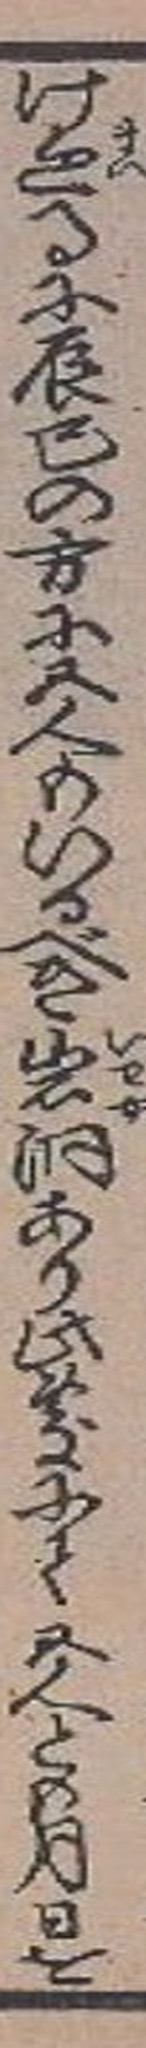け廻るに辰巳の方に五人もいるべき岩洞あり此処にて五人とも月日を
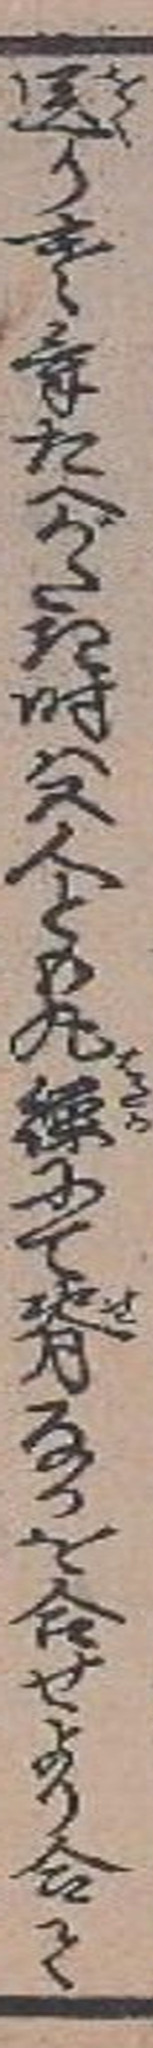送り寒気たへがたき時は五人とも丸裸にて背なかを合せより合て
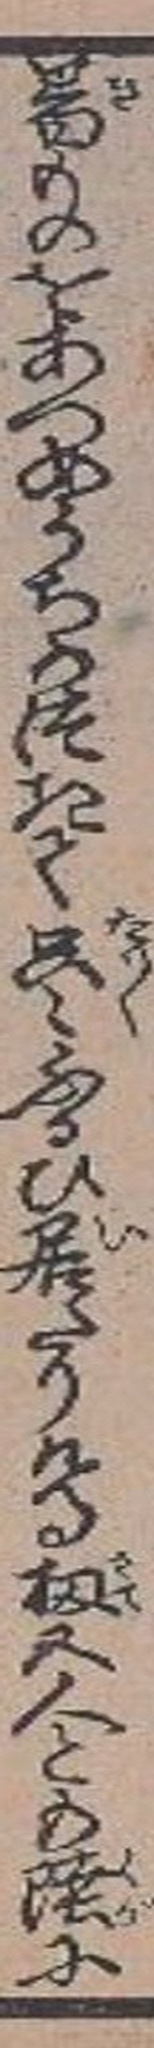着のものをあつめうちかつきて只々ふるひ居たりける扨五人とも陸に
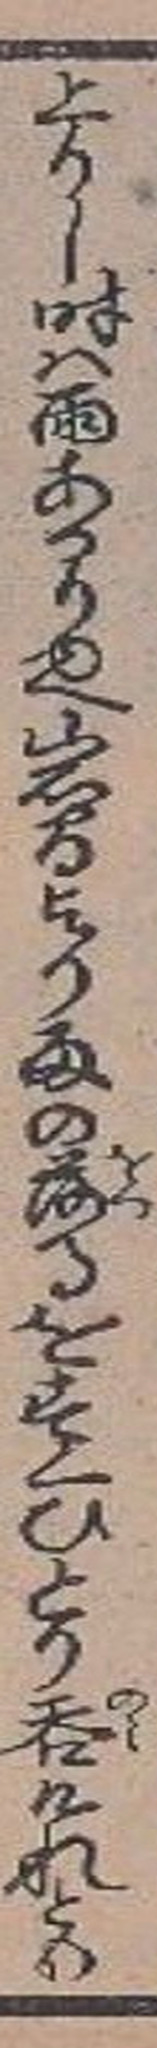上りし時は雨あかりゆへ岩間より雨の落るをすくひとり呑けれとも
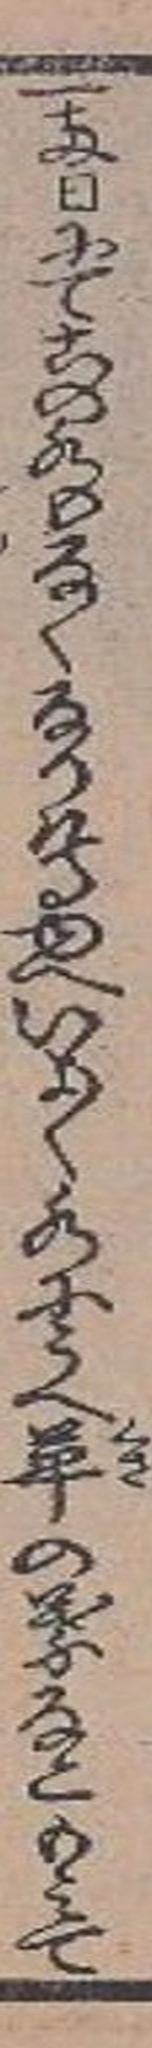一両日にてこの水もなくなりけるゆへいよ〳〵水にうへ草の葉なともみて
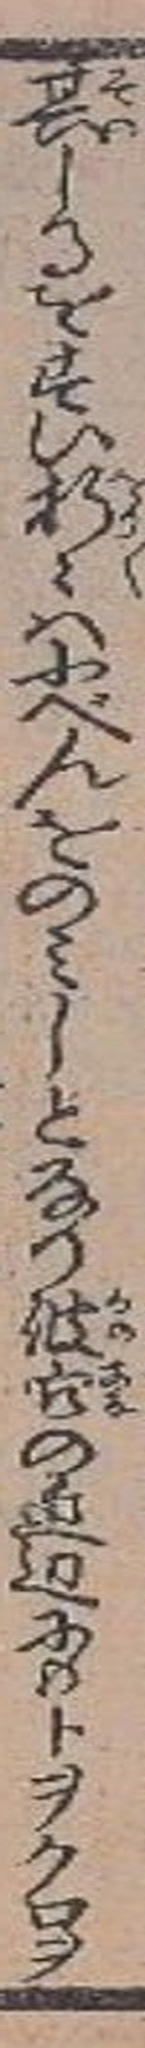其しるをすい折々は小べんをのみしとなり彼穴の近辺にもトヲクロヲ
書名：満次郎漂流記
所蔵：University of the Ryukyus Library
